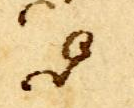5
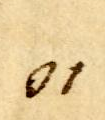10
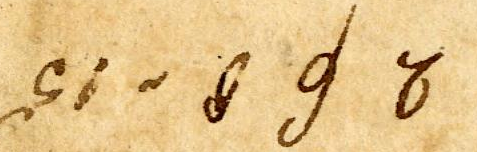2 6 8 - 15
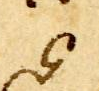5
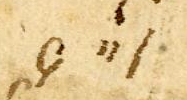1.. 5
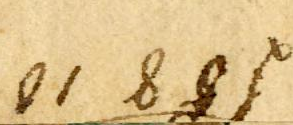£58 10
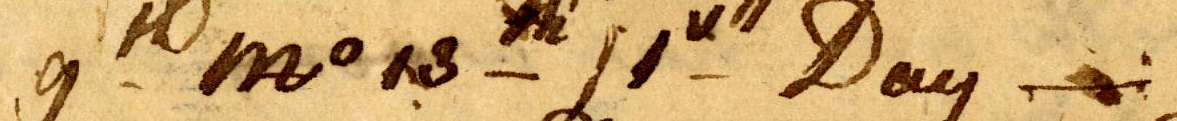9^th M^o 13^th- )1^st Day-
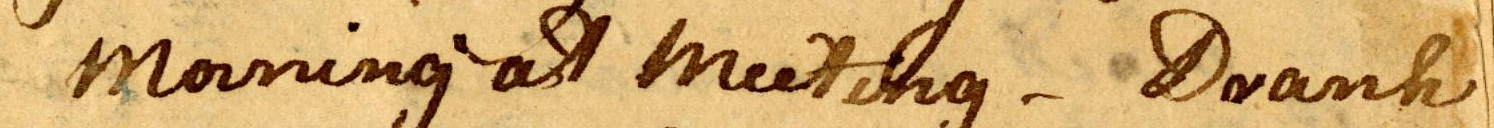morning at Meeting- Drank
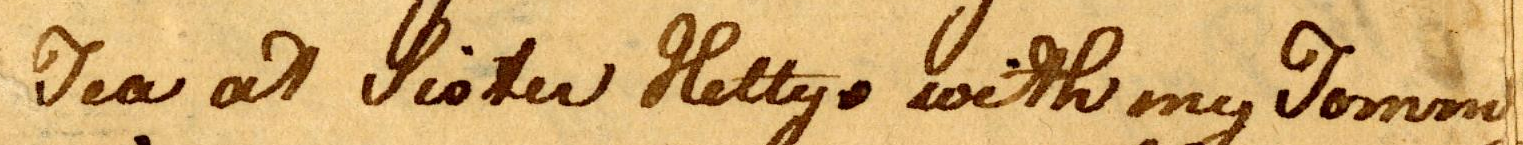Tea at Sister Hettys with my Tommy
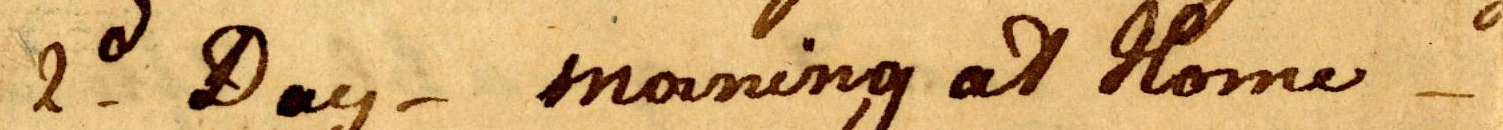2^d. Day- morning at Home-
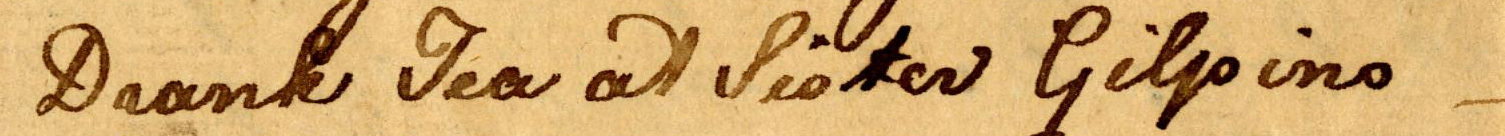Drank Tea at Sister Gilpins
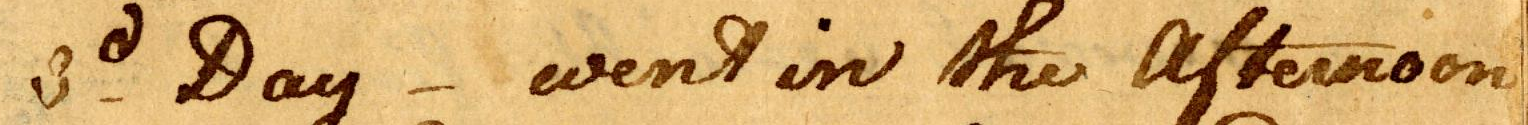3^d Day- event in the Afternoon
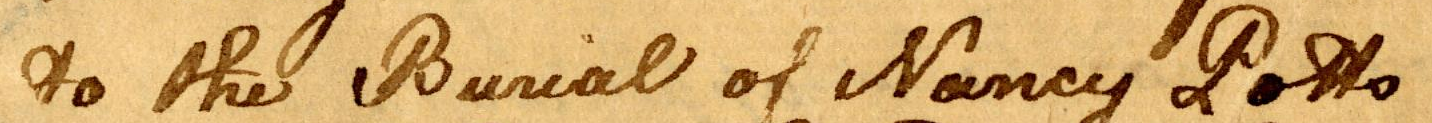to the Burial of Nancy Potts
